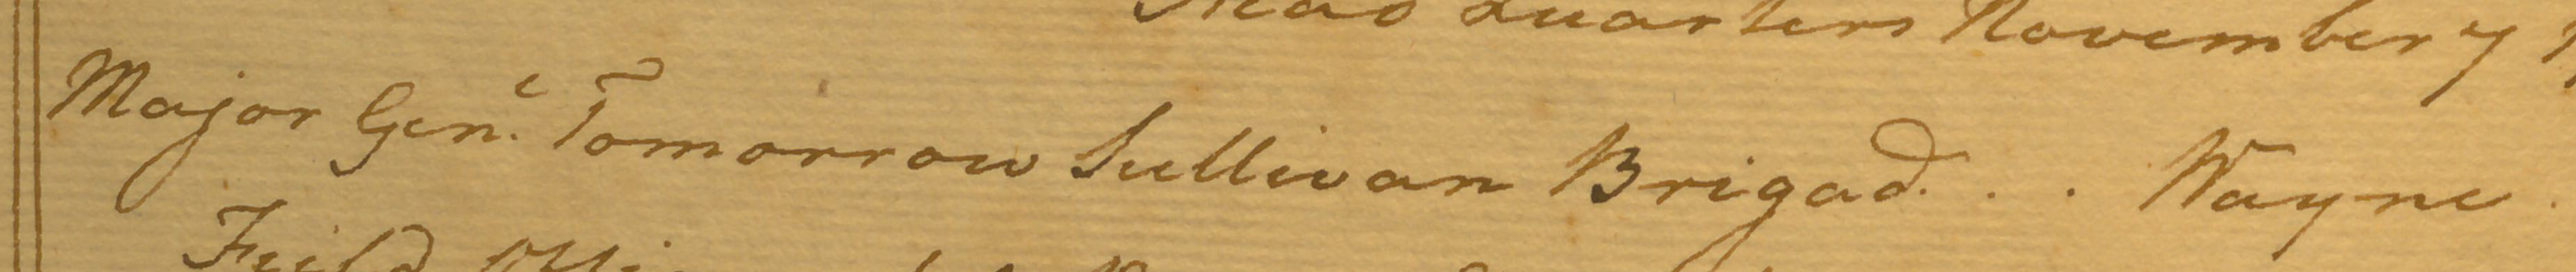Major Gen^l. Tomorrow Sullivan Brigad. .. Wayne
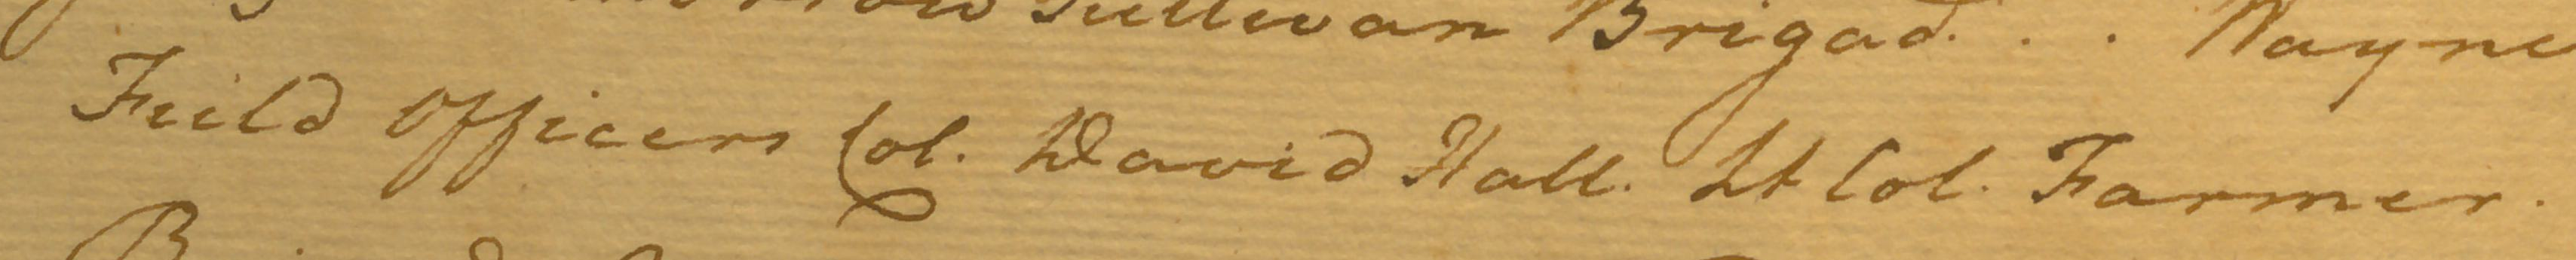Field Officers Col. David Hall. Lt Col. Farmer
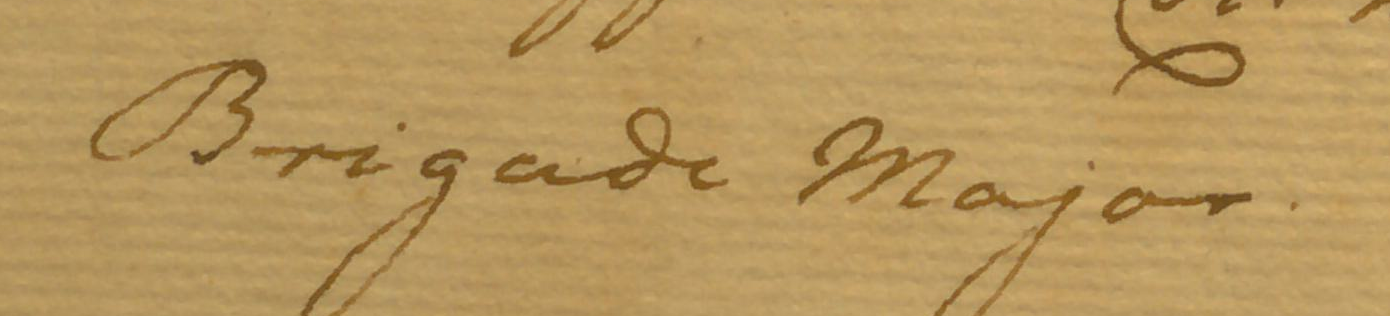Brigade Major
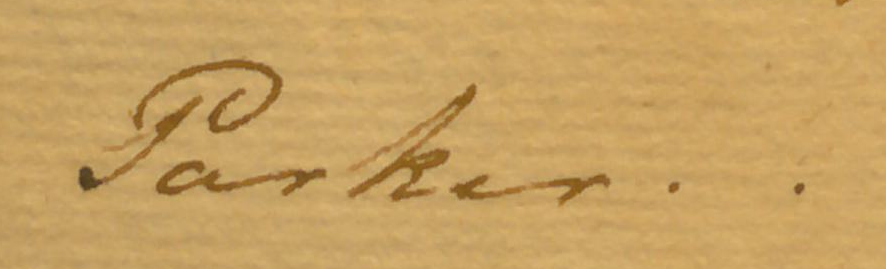Parker. .
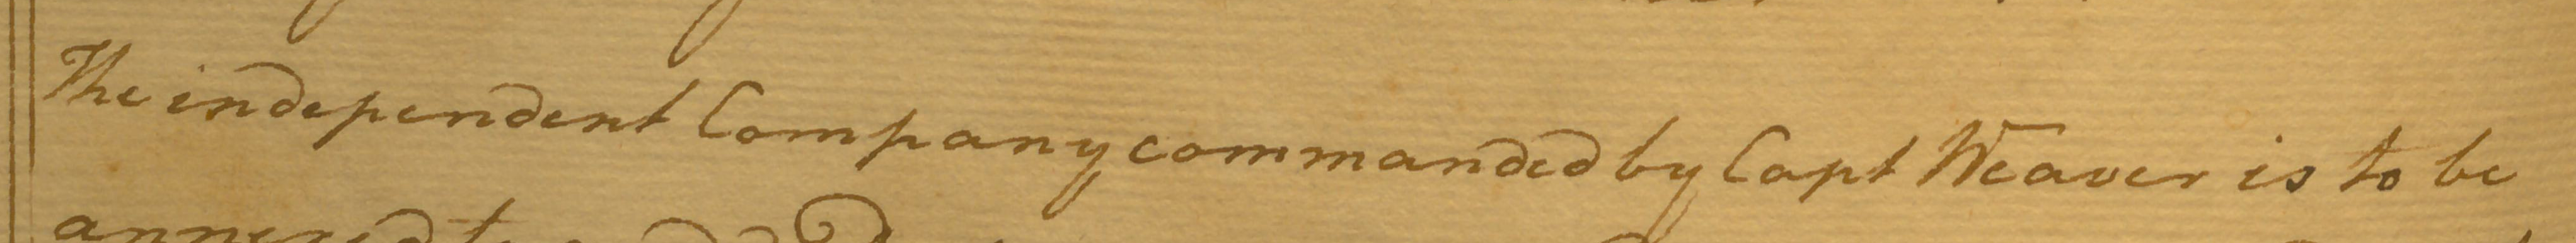The independent Company commanded by Capt Weaver is to be
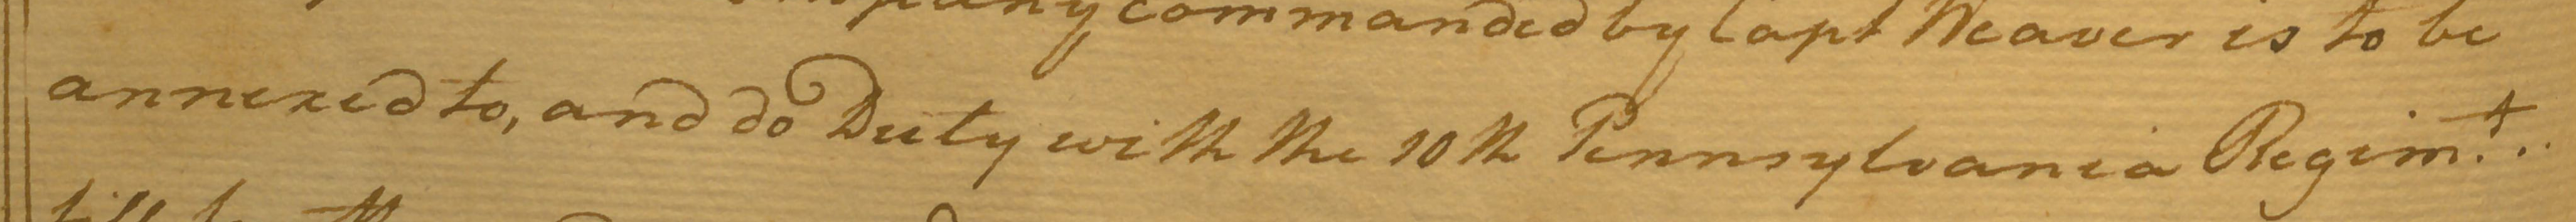annexed to, and do Duty with the 10th Pennsylvania Regim^t.
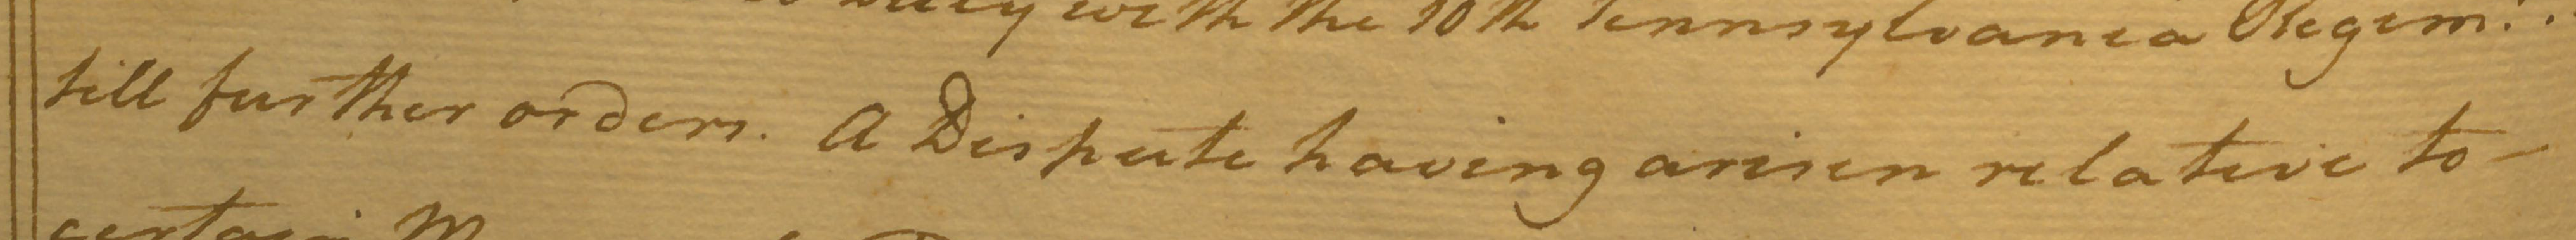till further orders. A Dispute having arisen relative to
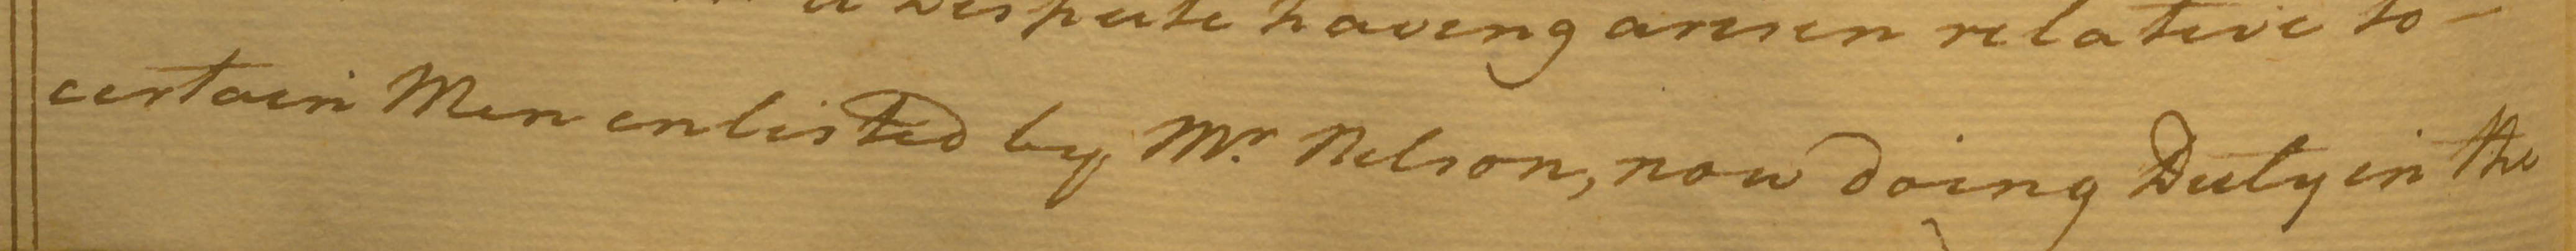certain Men enlisted by M^r. Nelson, now doing Duty in the
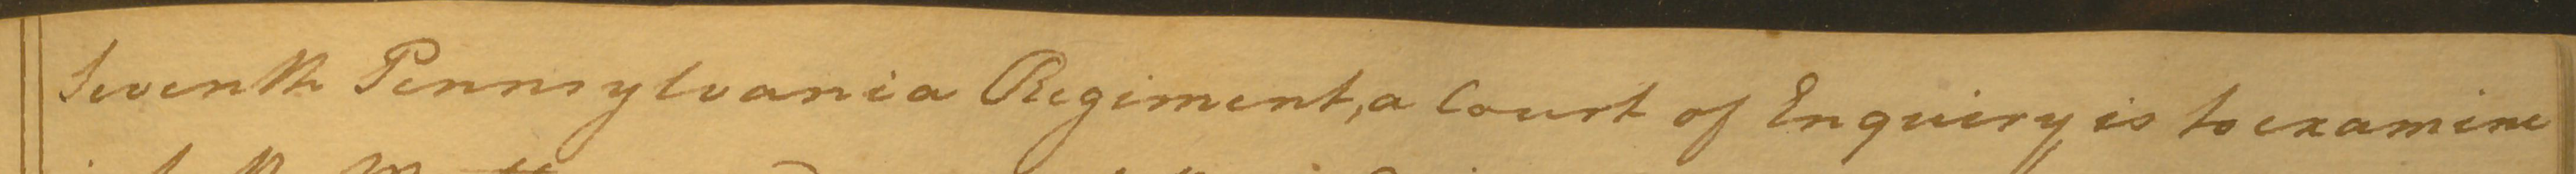seventh Pennsylvania Regiment, a Court of Enquiry is to examine
